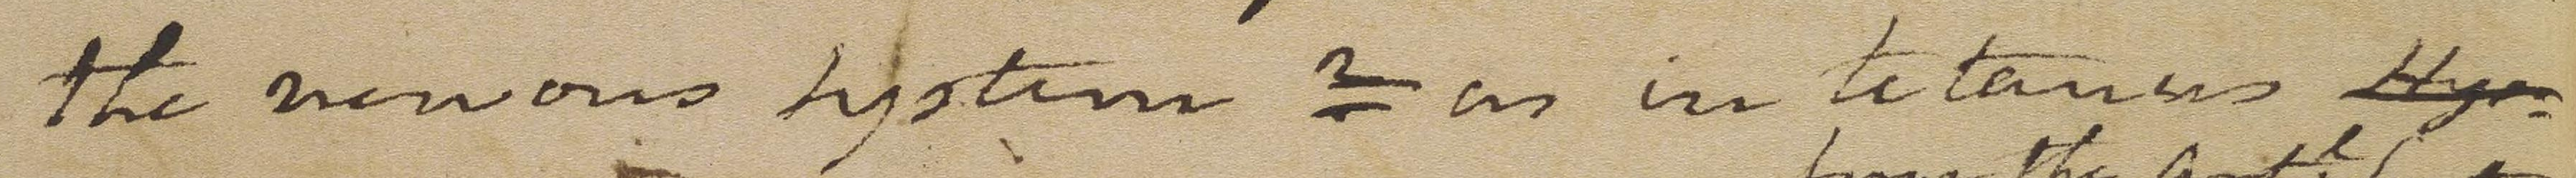the nervous system? As in tetanus hypo-
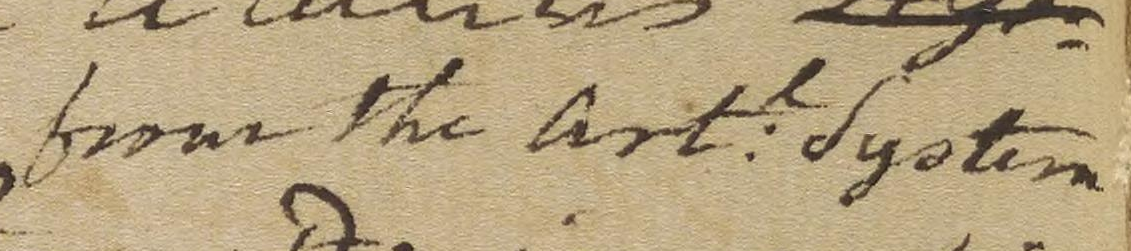from the art^l: system
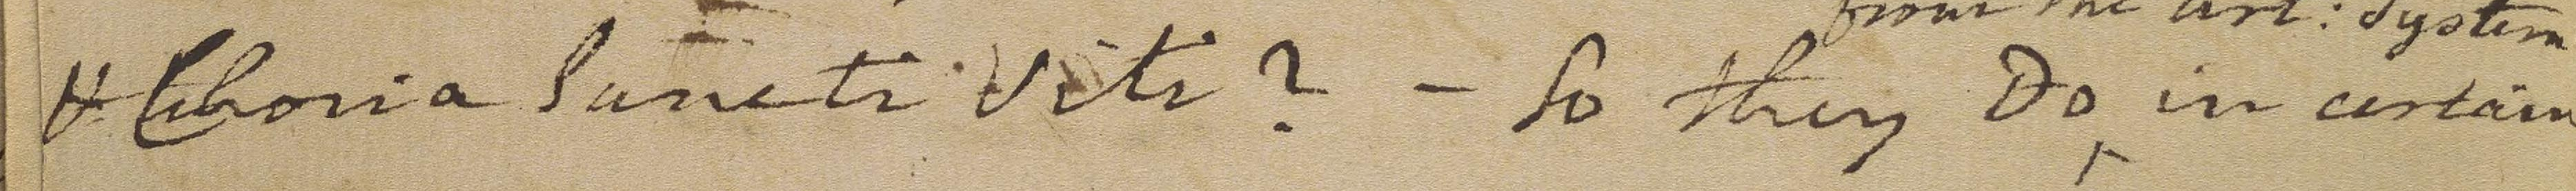-choria sarets vits? So they do ^ in certain
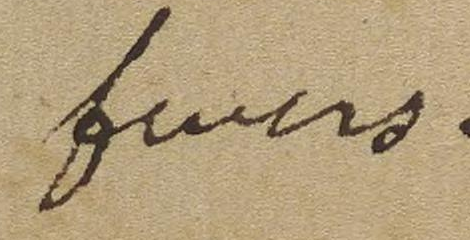fevers.
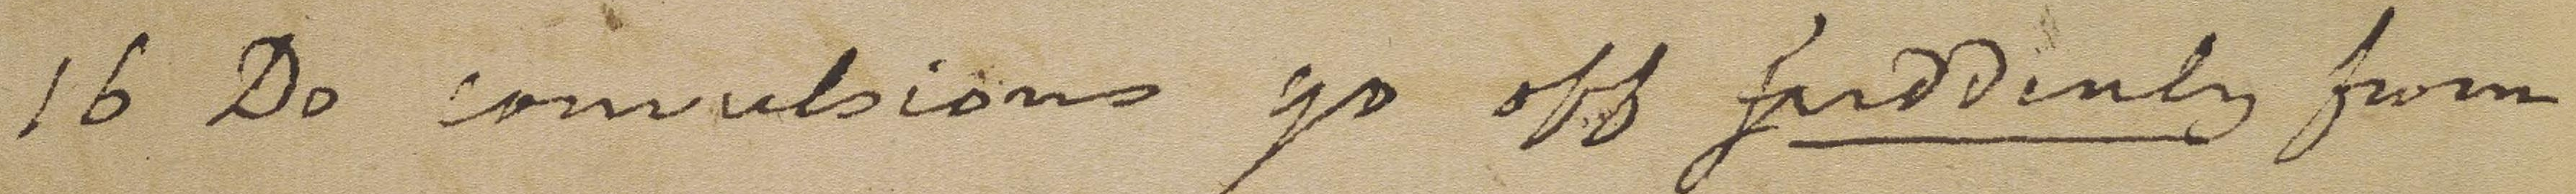16 Do convulsions go off suddenly from
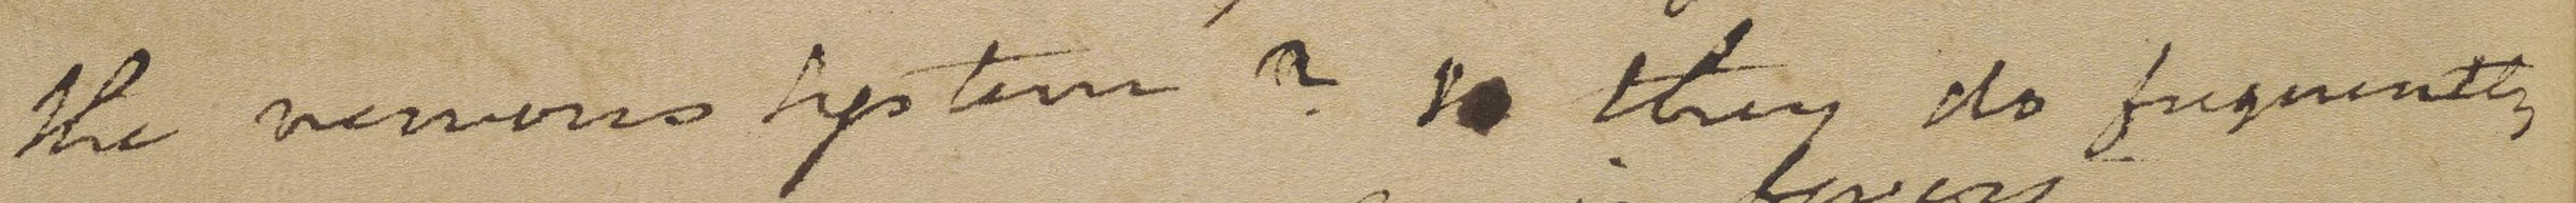the nervous system? So they do frequently
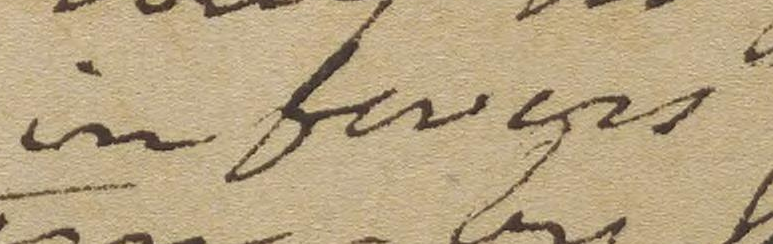in fevers
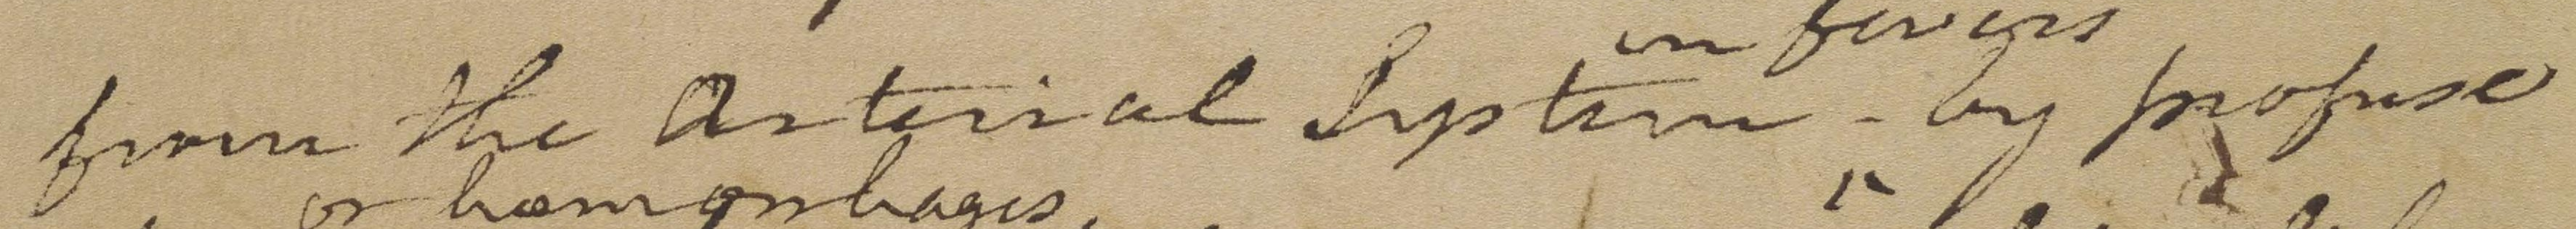from the arterial system ^ by profuse
